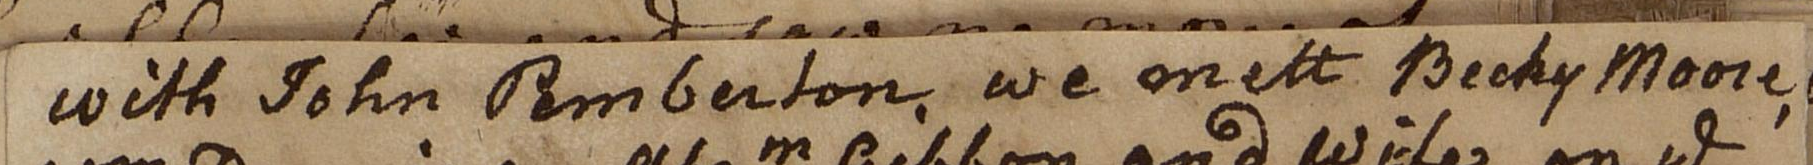with John Pemberton, we mett Becky Moore,
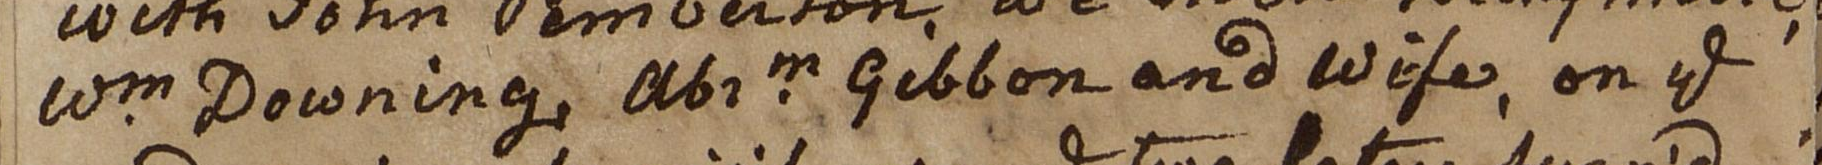W^m. Downing, Abr^m. Gibbon and Wife, in y^e
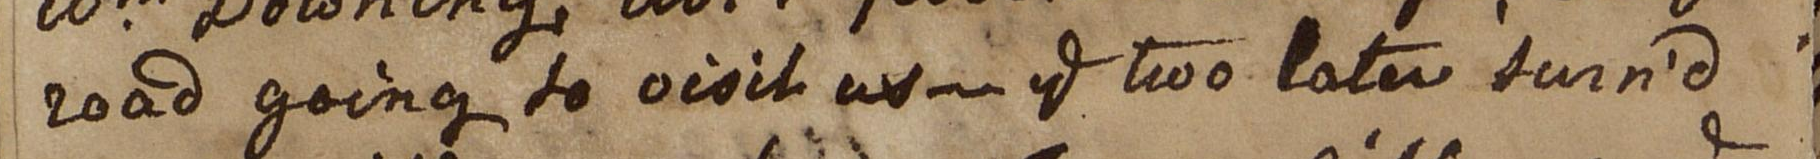road going to visit us- y^e two later turn'd
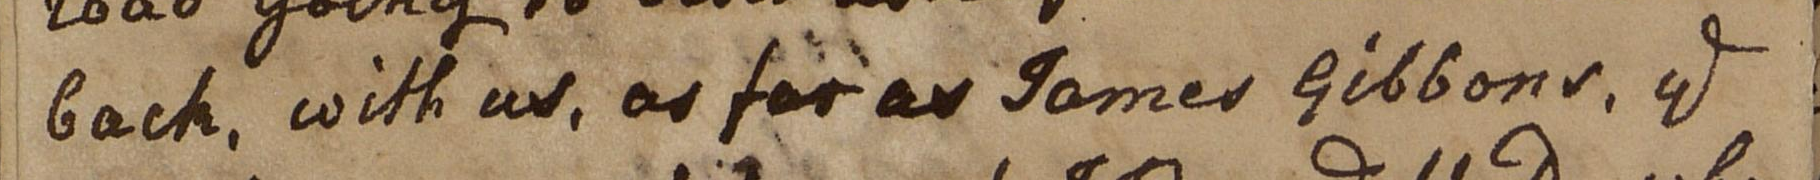back, with us, as far as James Gibbons, y^e
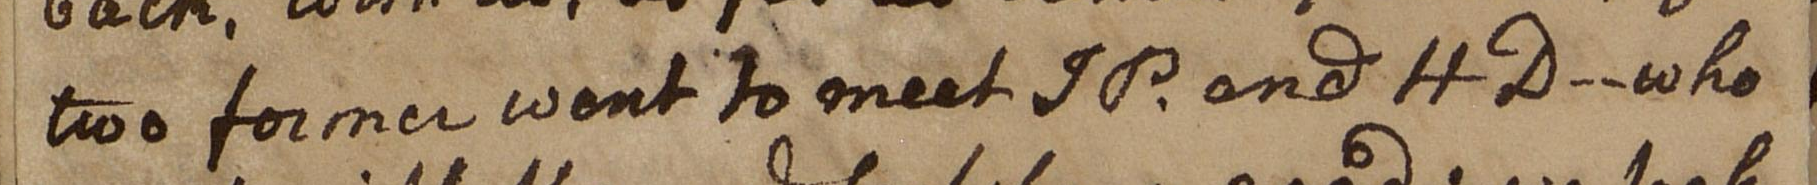two former went to meet J P. and H D-who
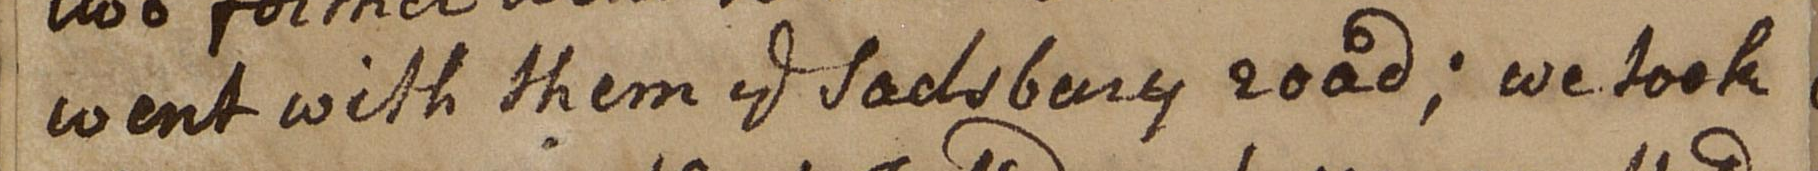went with them y^e Sadsbury road; we took
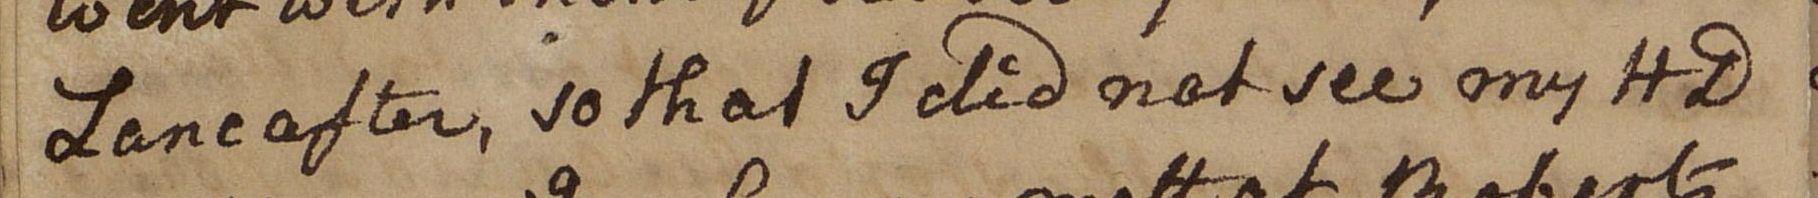Lancaster, so that I did not see my HD
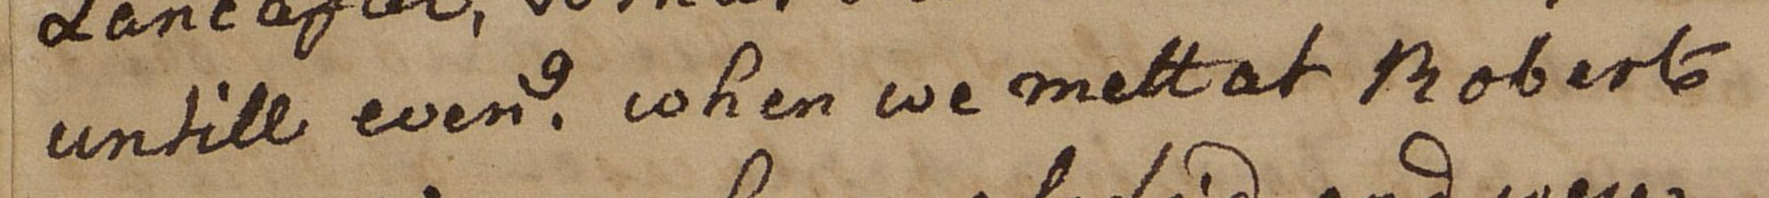untill even^g. when we mett at Roberts
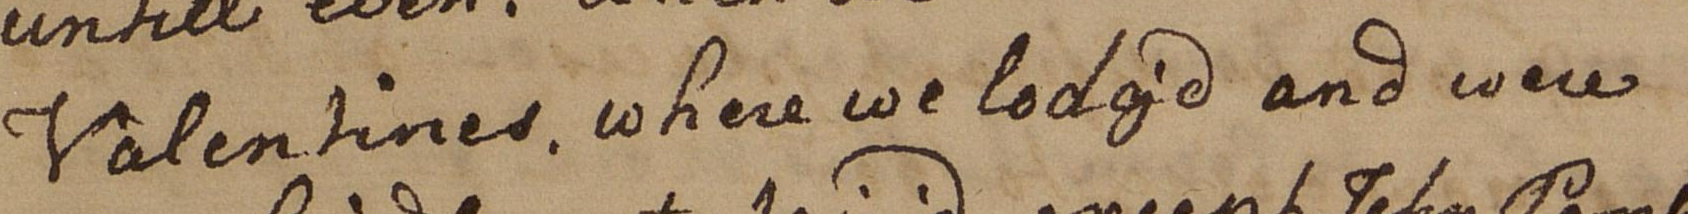Valentines, where we lodg'd and were
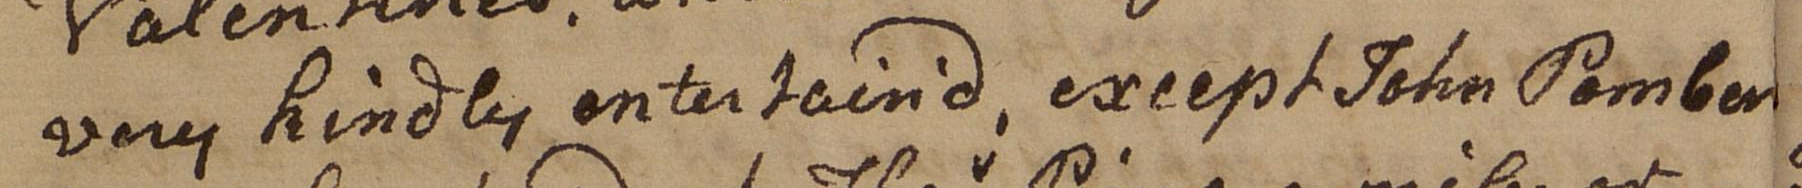very kindly entertain'd, except John Pember
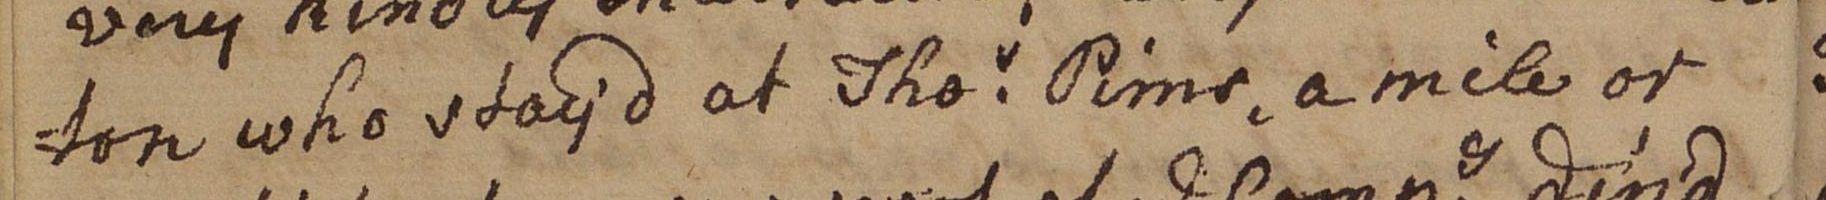-ton who stay'd at Tho^s. Pims, a mile or
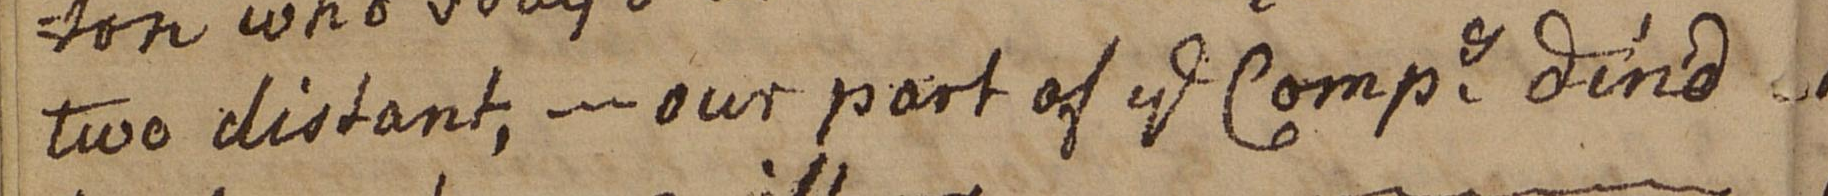two distant,- our part of y^e Comp^y. din'd
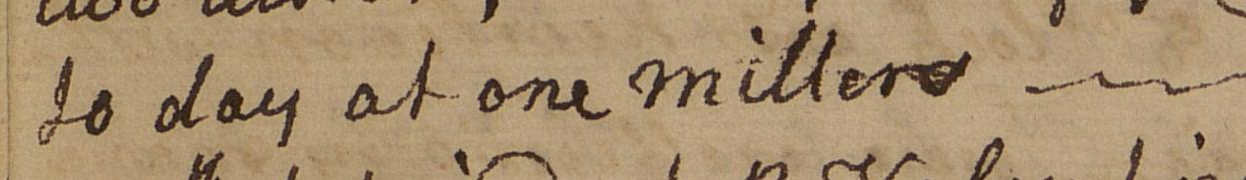to day at one millers-
